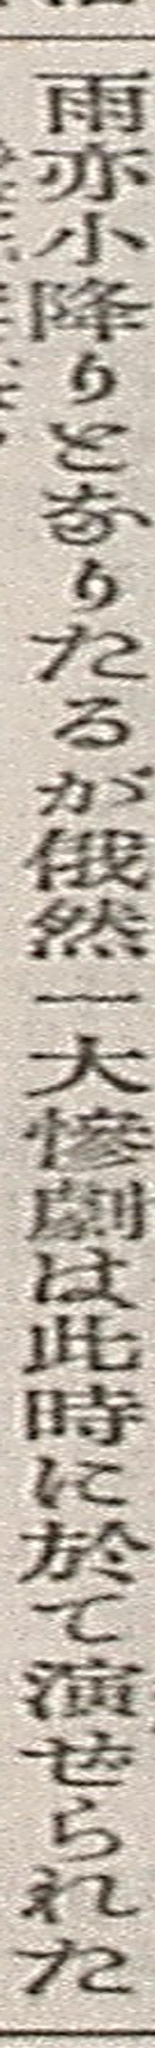雨亦小降りとなりたるが俄然一大惨劇は此時に於て演ぜられた
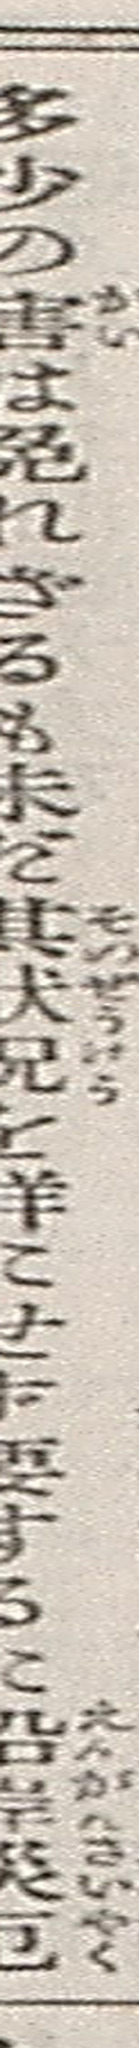多少の害は免れざるも未だ其状況を詳にせず要するに沿岸災厄
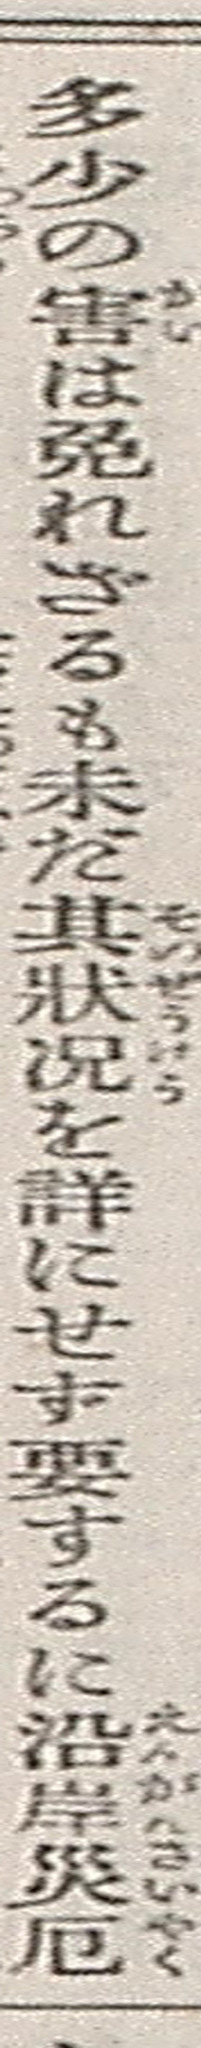多少の害は免れざるも未だ其状況を詳にせず要するに沿岸災厄
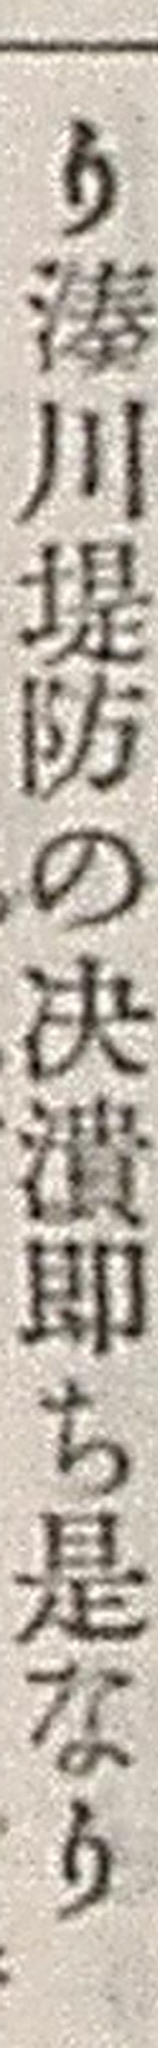り湊川堤防の决潰即ち是なり
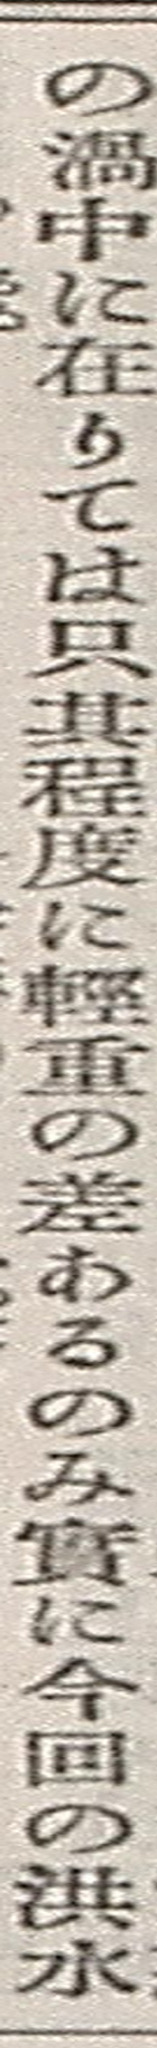の渦中に在りては只其程度に軽重の差あるのみ実に今回の洪水
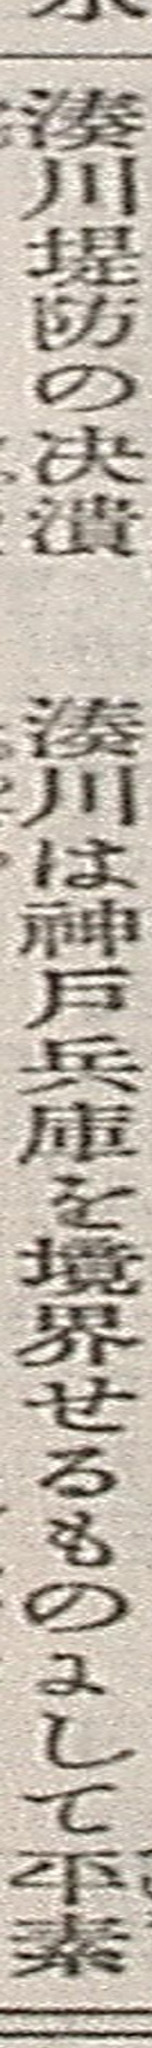湊川堤防の决潰湊川は神戸兵庫を境界せるものにして平素
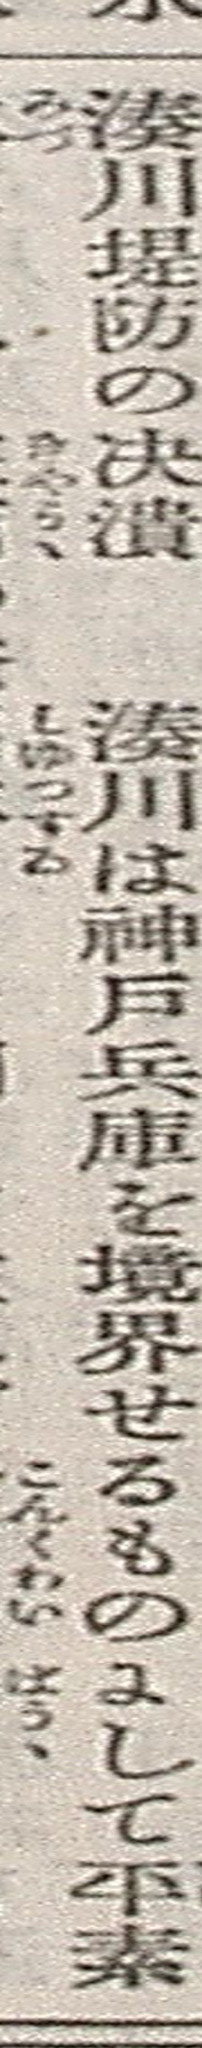湊川堤防の决潰湊川は神戸兵庫を境界せるものにして平素
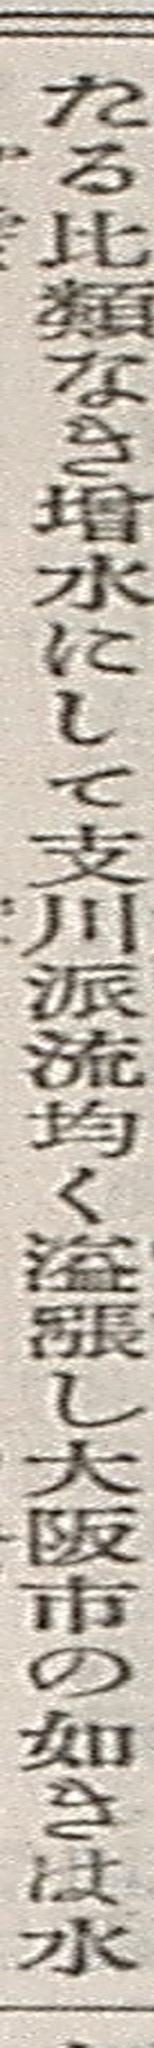たる比類なき増水にして支川派流均く溢漲し大阪市の如きは水
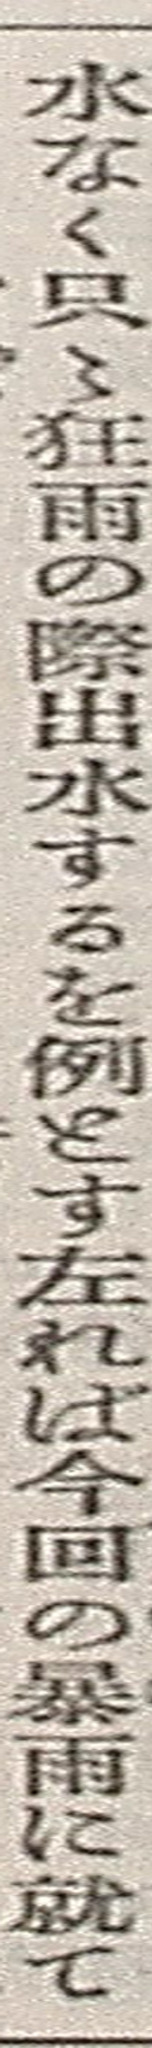水なく只々狂雨の際出水するを例とす左れば今回の暴雨に就て
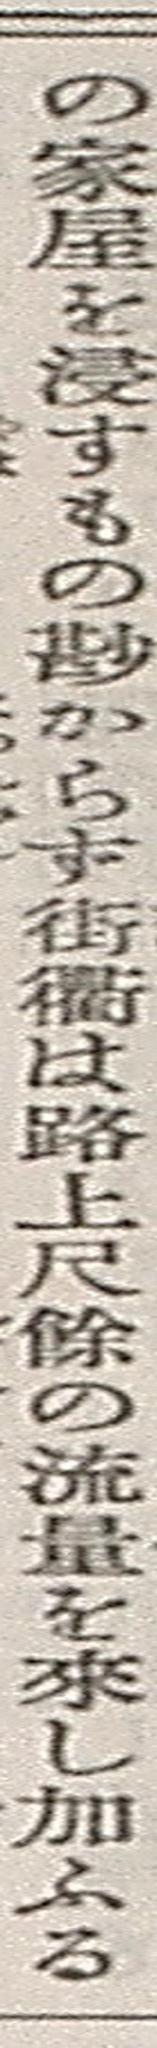の家屋を浸すもの尠からず街衢は路上尺餘の流量を来し加ふる
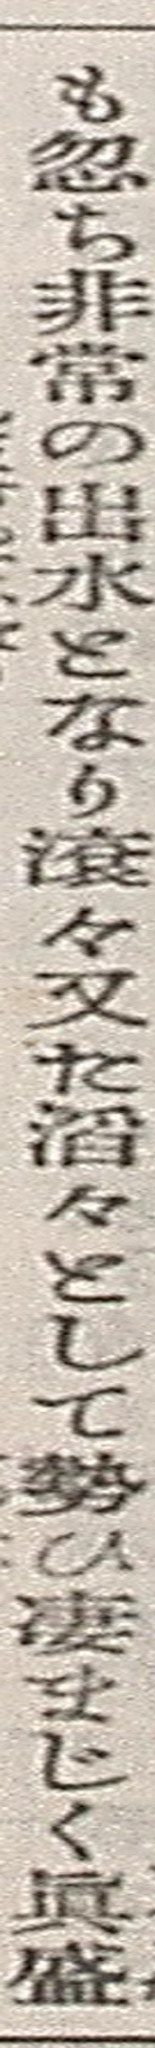も忽ち非常の出水となり滾々又た滔々として勢ひ凄まじく真盛
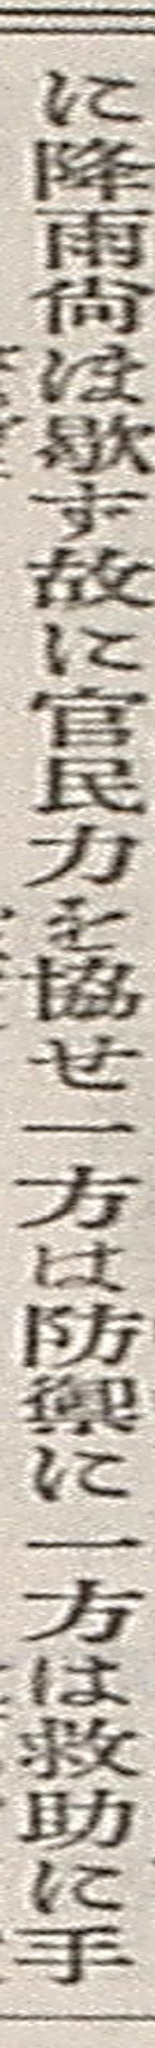に降雨尚ほ歇ず故に官民力を協せ一方は防禦に一方は救助に手
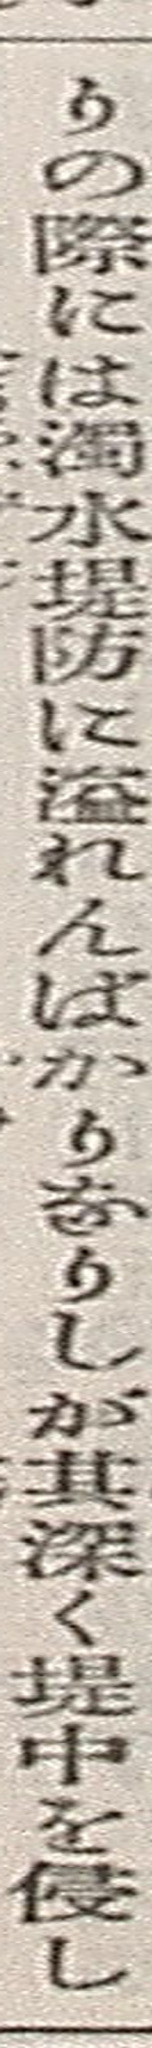りの際には濁水堤防に溢れんばかりなりしが其深く堤中を侵し
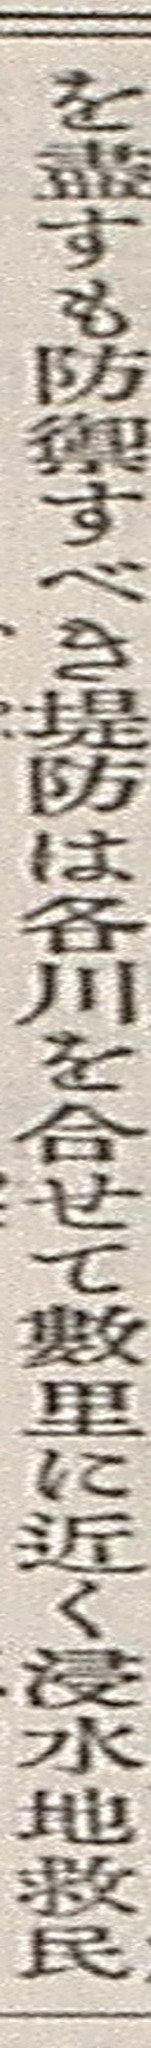を尽すも防禦すべき堤防は各川を合せて数里に近く浸水地救民
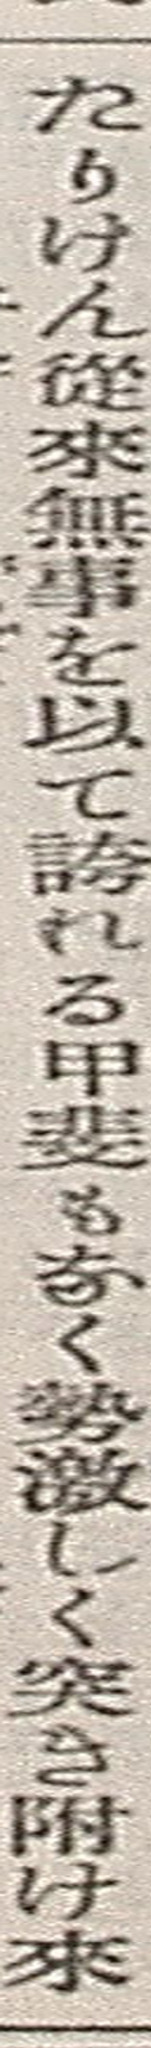たりけん従来無事を以て誇れる甲斐もなく勢激しく突き附か來
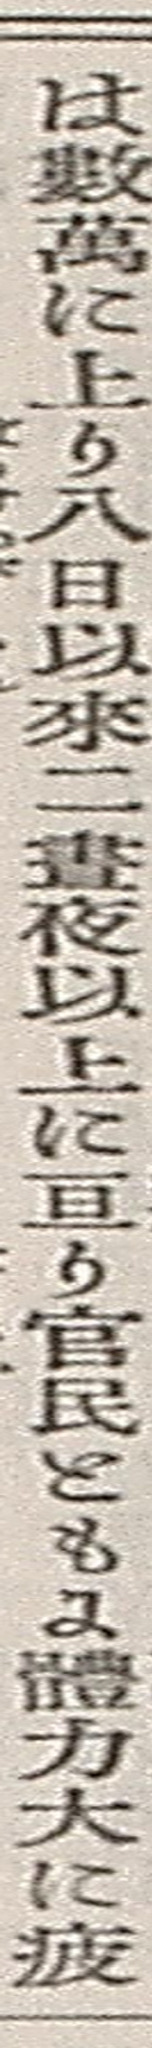は数万に上り八日以来二晝夜以上に亘り官民ともに体力大に疲
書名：風俗畫報臨時増刊第百二十八號　洪水被害録（下）
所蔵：東京大学地震研究所図書室 Earthquake Research Institute Library, The University of Tokyo, JAPAN
